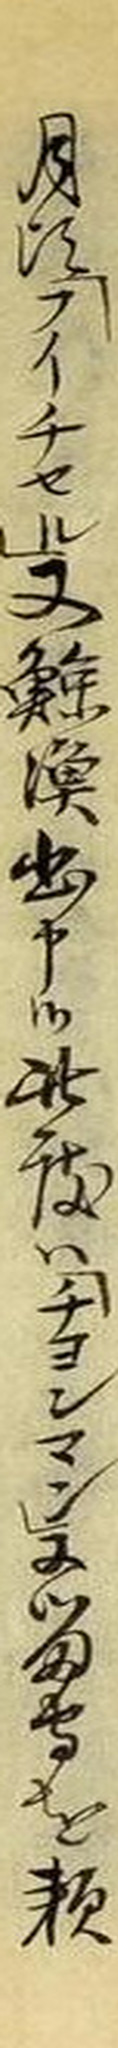月頃「フイチセル」又鯨漁出申候此度ハ「チヨンマン」又留守を頼
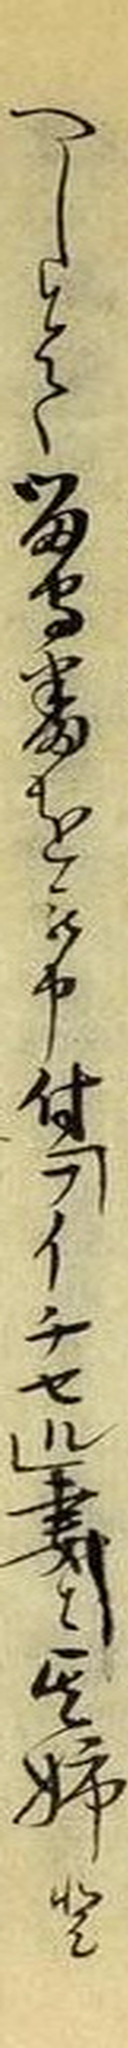へしとて留守番を被申付「フイチセル」妻と其姉と
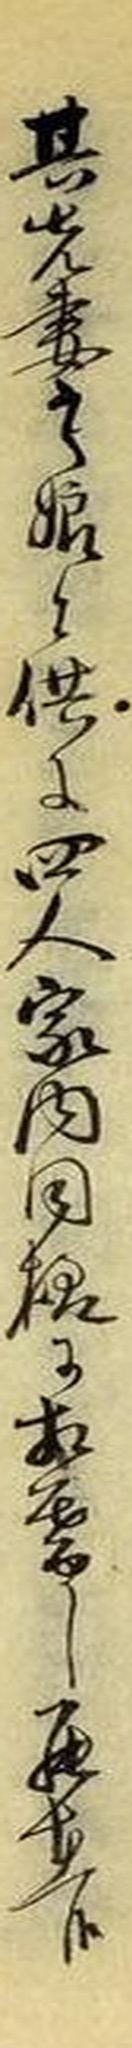其先妻之娘と供に四人家内同様に相暮し罷在候
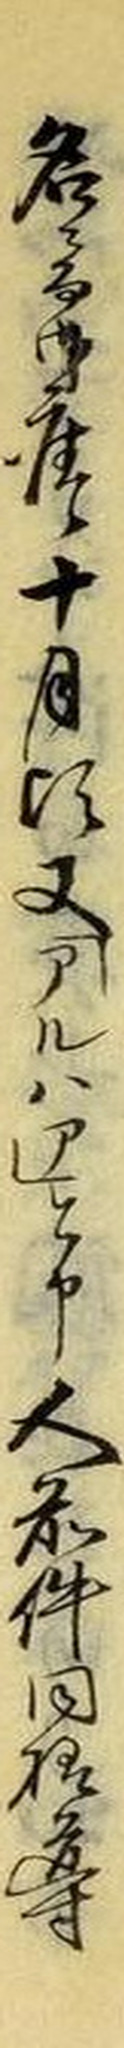名ニ而御座候十月頃又「アルハア」と申人前件同様導
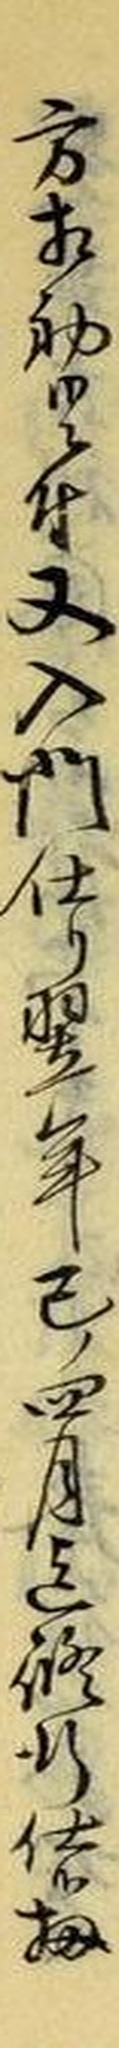方相初候ニ付又入門仕り翌年巳ノ四月迄修行仕候扨
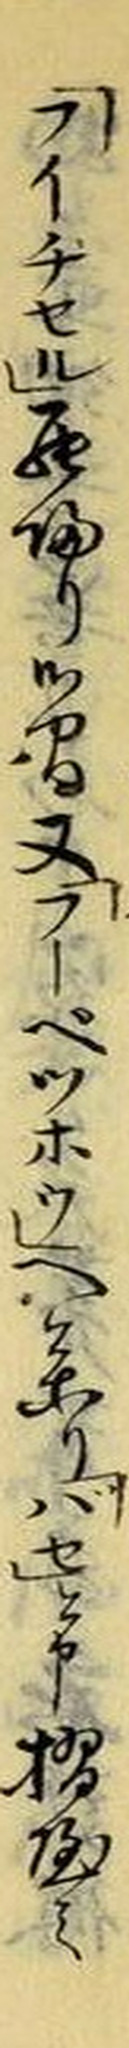「フイチセル」罷帰り候間又「フーぺツホウ」へ参り「バセ」と申摺屋之
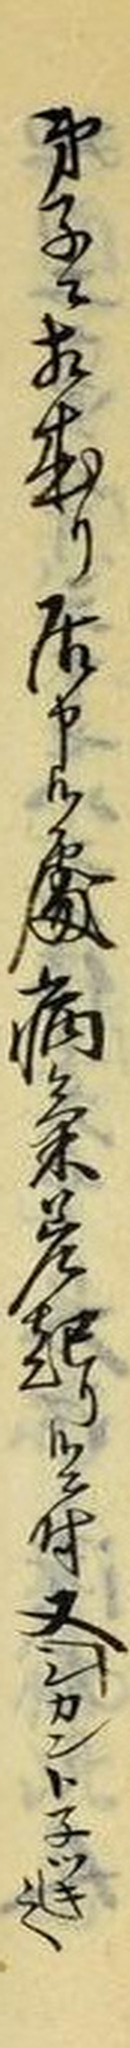弟子二相成り居申候處病気差起り候二付又「シカントネツキ」之
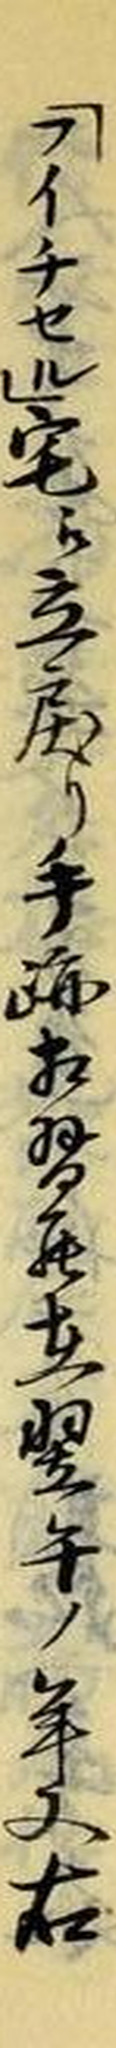「フイチセル」宅へ立戻り手跡相習罷在翌午ノ年又右
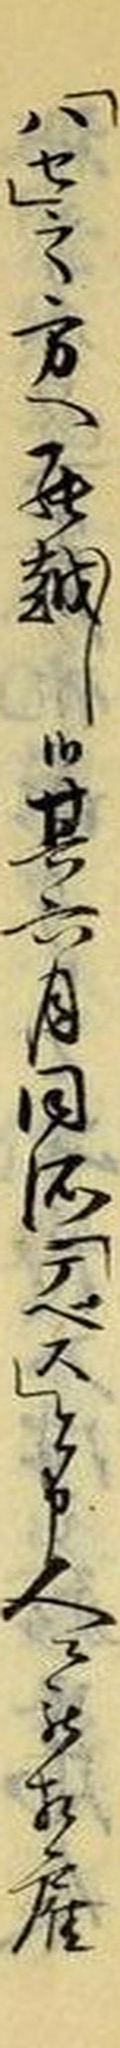「ハセ」之方へ罷越し候其六月同所「テべス」と申人二被相雇
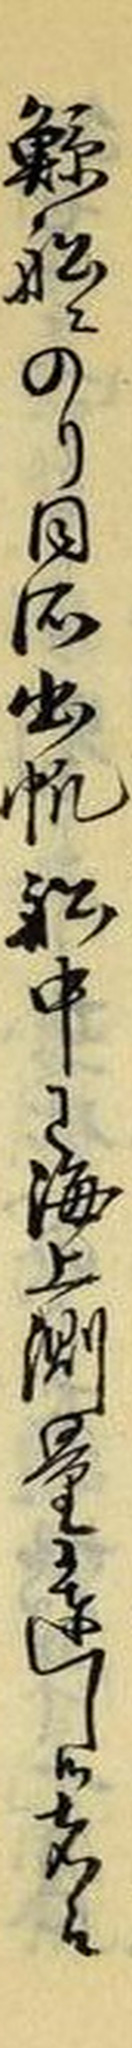鯨船ニのり同所出帆船中に海上測量達し候者へ
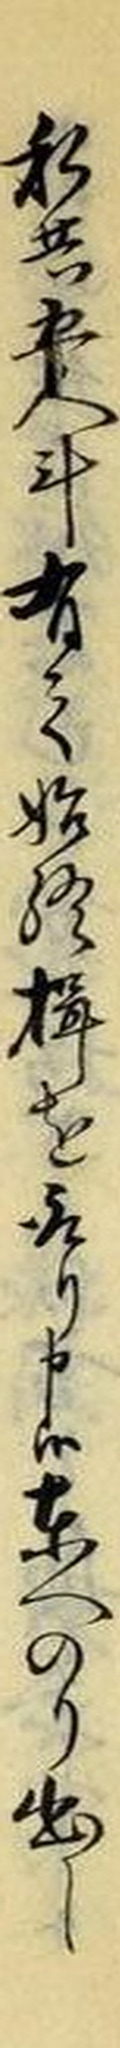私共五人計有之始終楫を取り申候東へのり出し
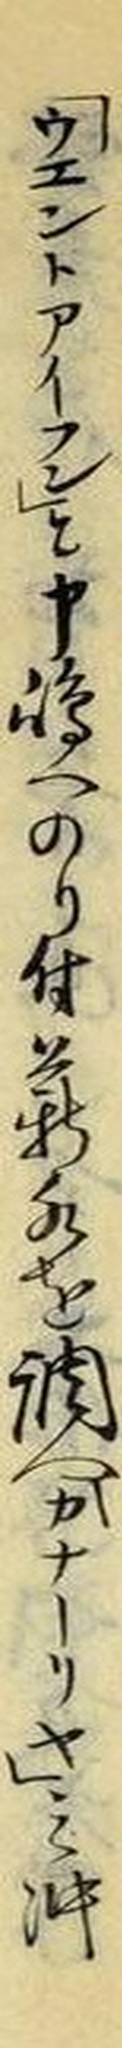「ウエントアイフン」と申島へのり付薪水を調へ「カナーリヤ」之沖
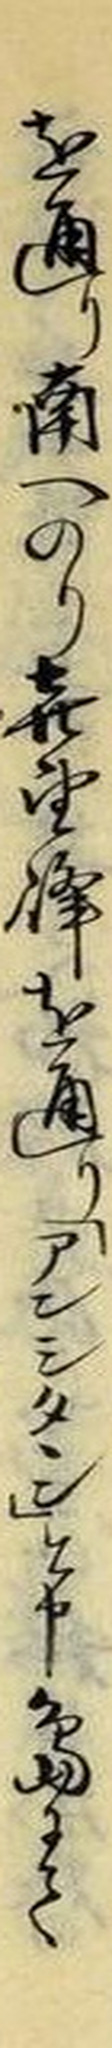を通り南へのり喜望峰を通り「アンシタシ」と申島にて
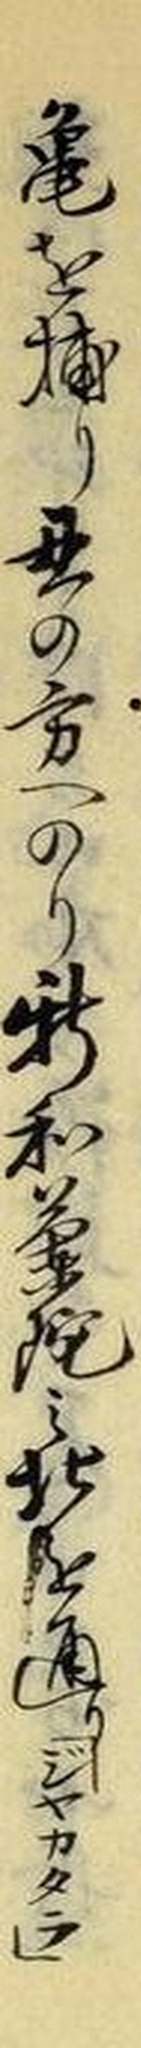亀を捕り丑の方へのり新和蘭陀之北を通り「ジヤカタラ」
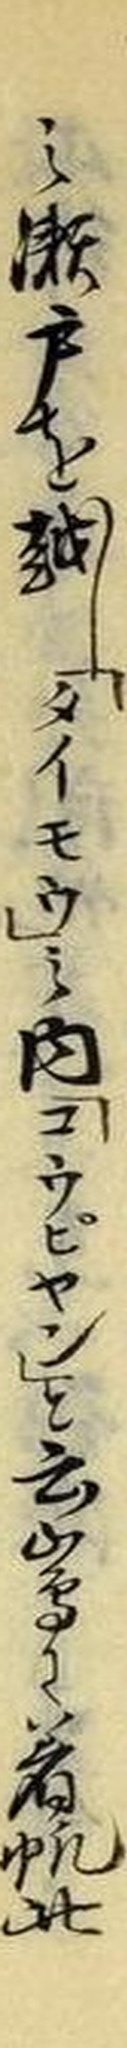之瀬戸を越し「タイモウ」の内「コウピヤン」と云島に着帆此
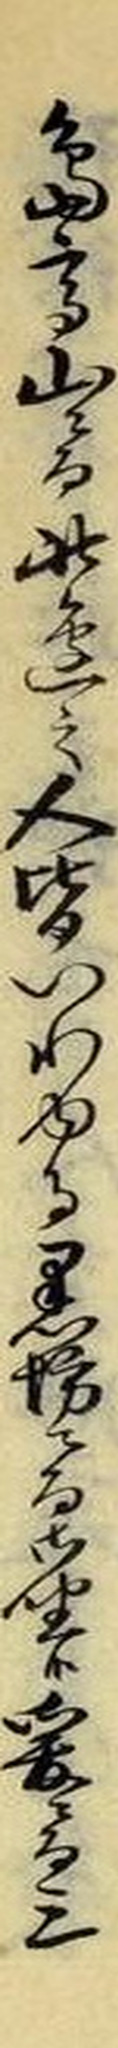島高山ニ而此島之人皆いわゆる黒坊ニ而御座候爰ニ而三
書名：漂客談奇（備考雑録写8）
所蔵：福井県文書館 Fukui Prefectural Archives
